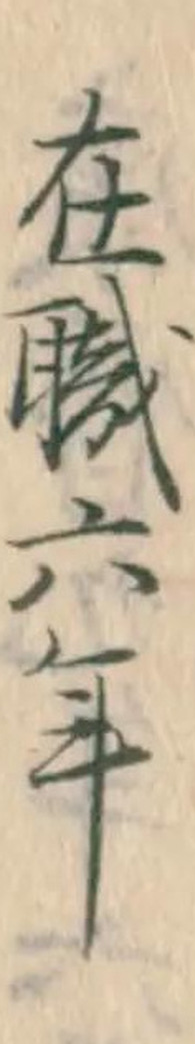在職六年
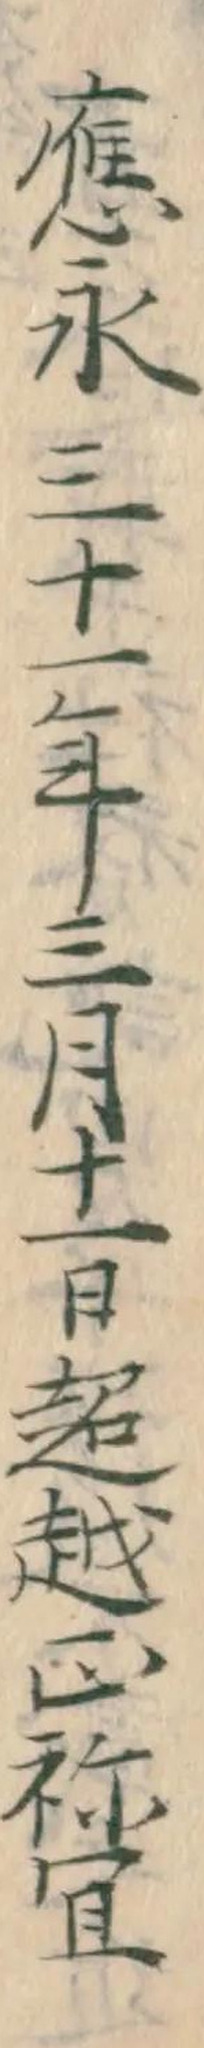盛久応永三十一年三月十一日超越正祢宜
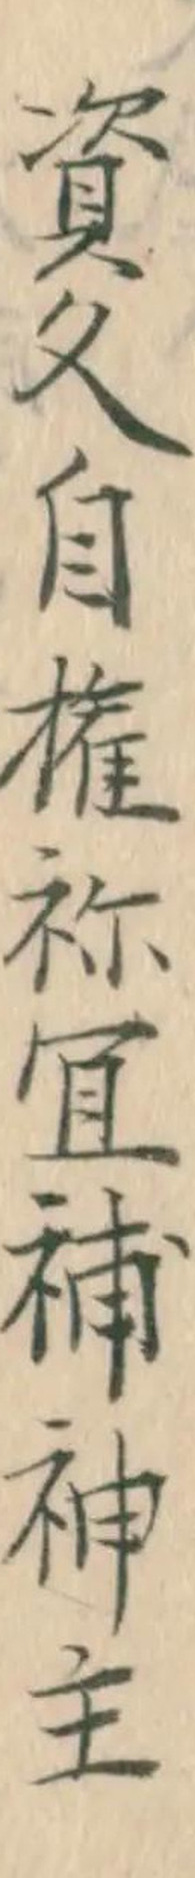資久自権祢宜補神主
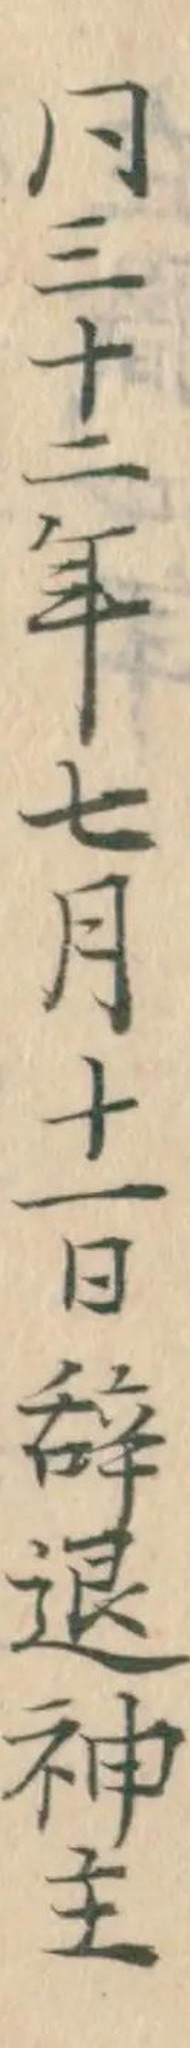同三十二年七月十一日辞退神主
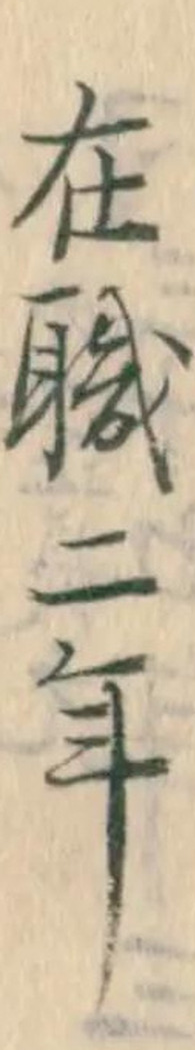在職二年

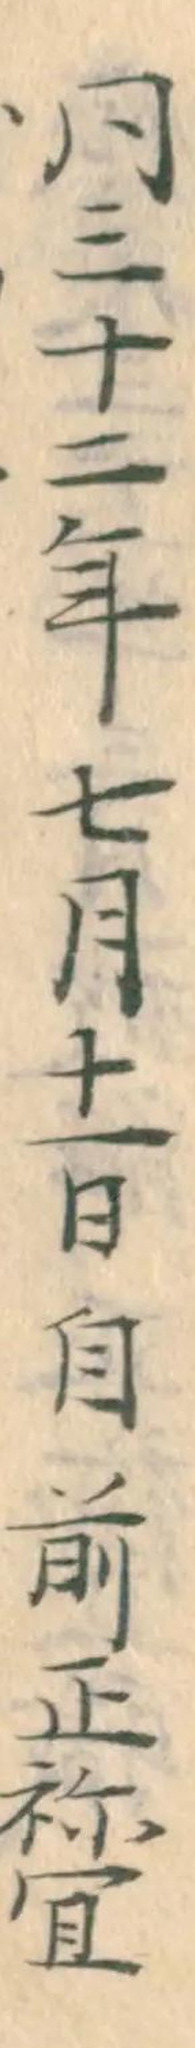同三十二年七月十一日自前正祢宜
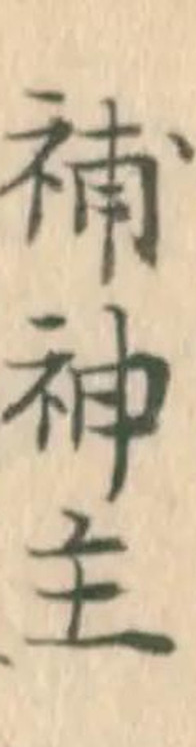補神主
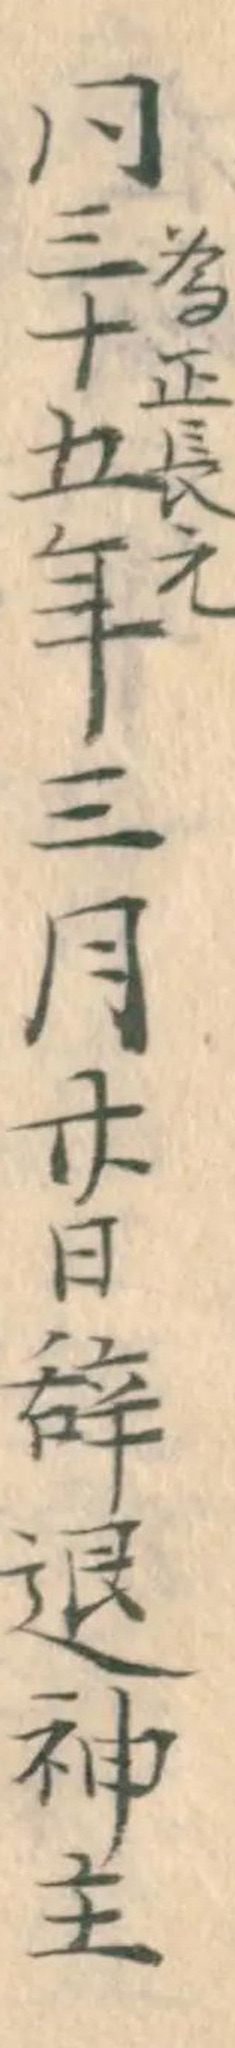同三十五年三月廿日辞退神主
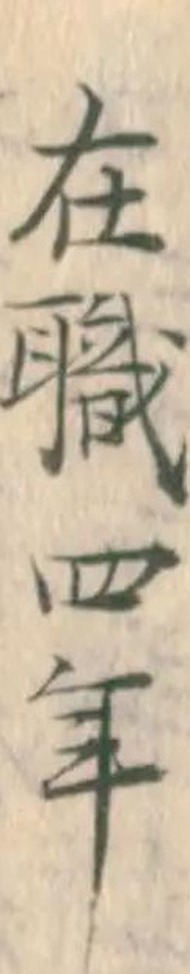在職四年
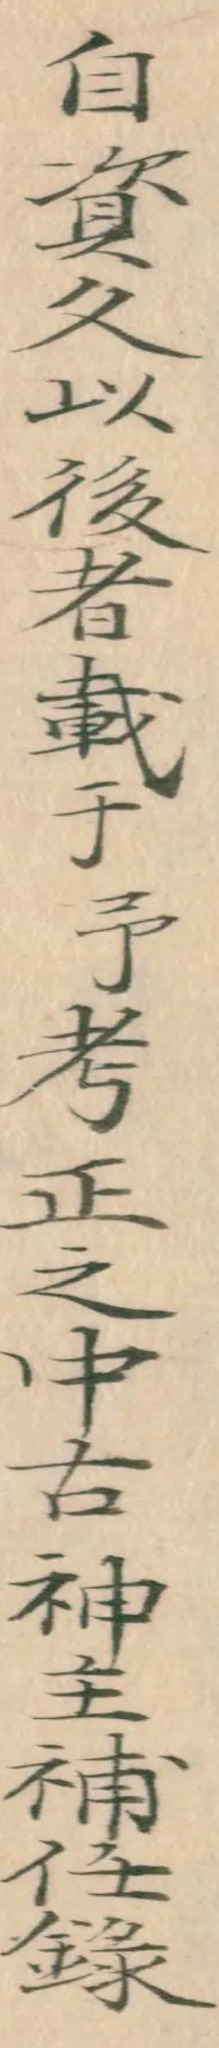自資久以後は載于予考正之中古神主補任録
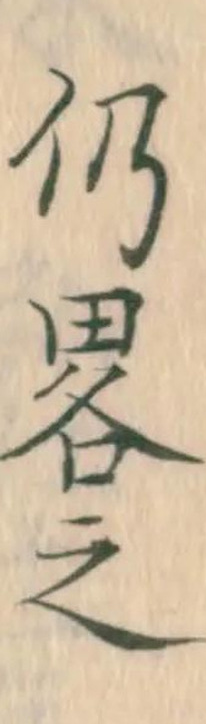仍略之

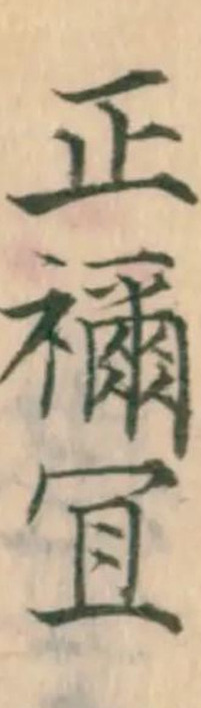正祢宜
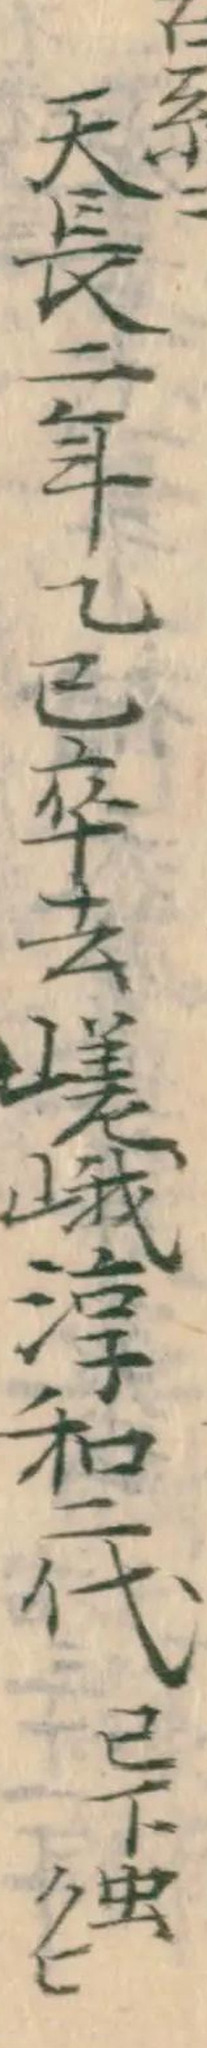天長二年乙己卒去嵯峨淳和二代已下虫クヒ

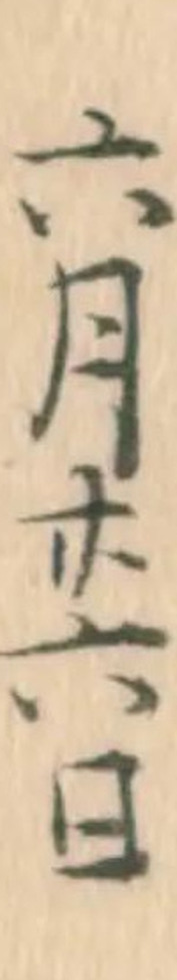六月十一日
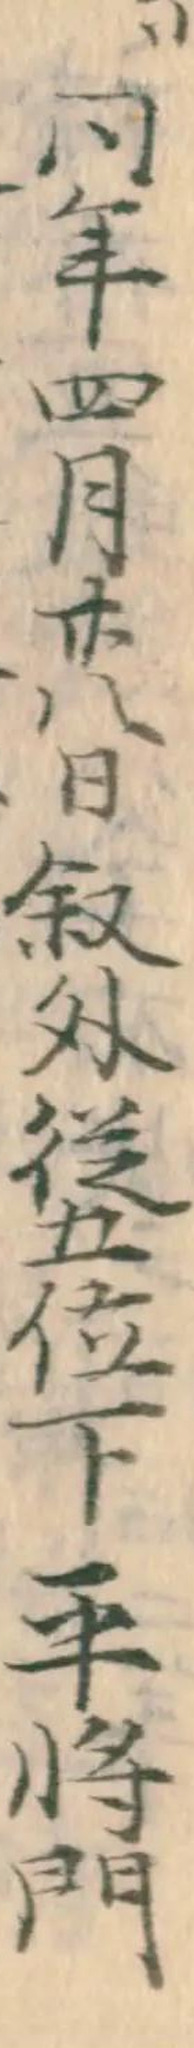同年四月廿八日叙外従五位下平将門
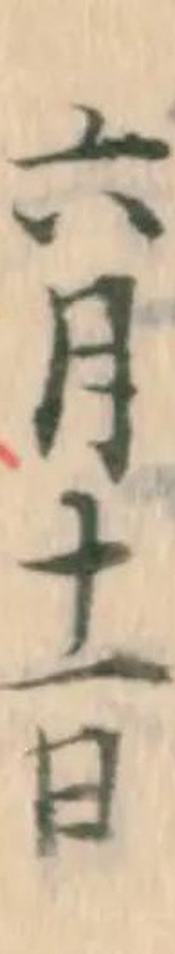六月十一日
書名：賀茂社記録. 第23冊
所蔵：国立国会図書館 National Diet Library, JAPAN
